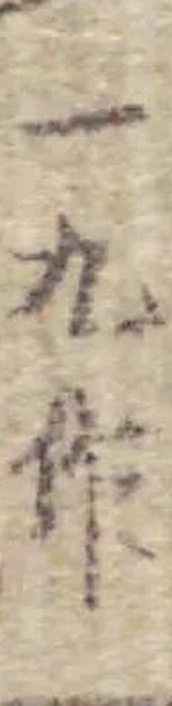一九作
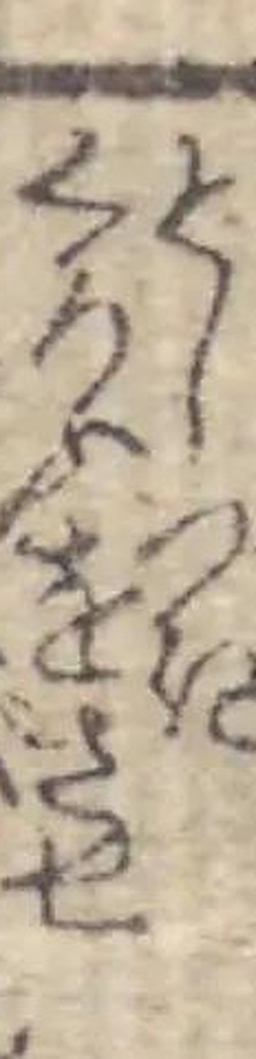くろふをさせ
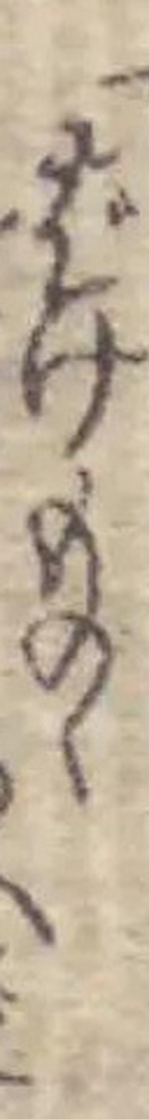〽ばけものゝ
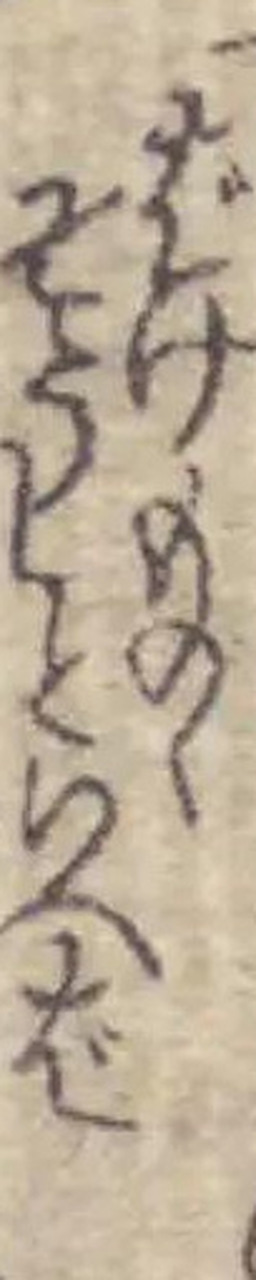そうしといへば
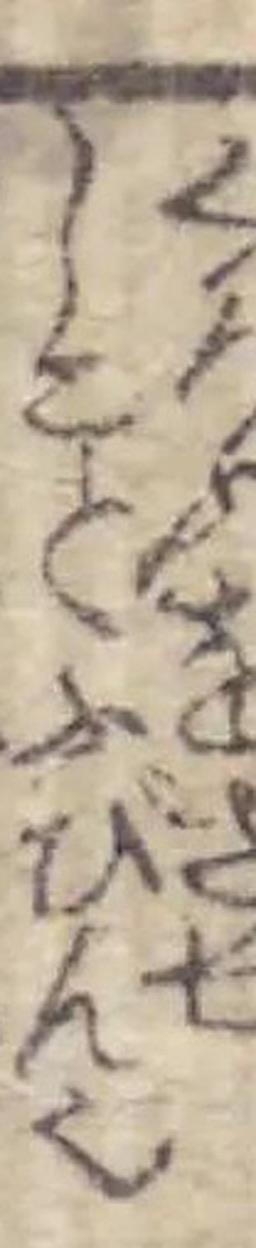しことふびん也
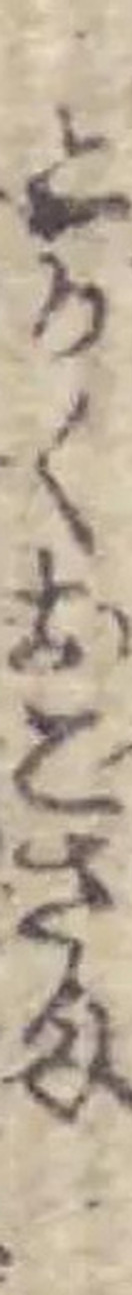とかくおこさま
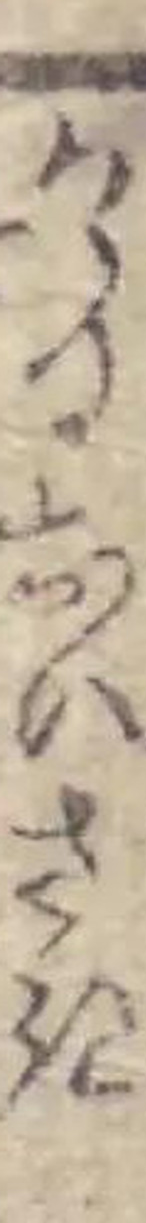かゝるおいさき
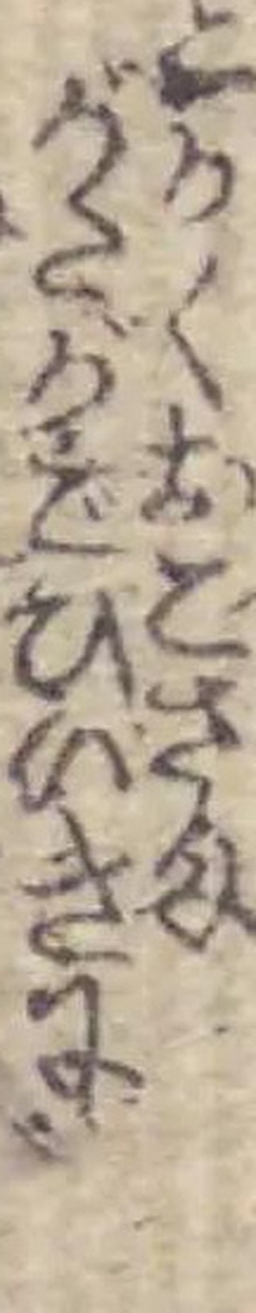がたがごひいきに
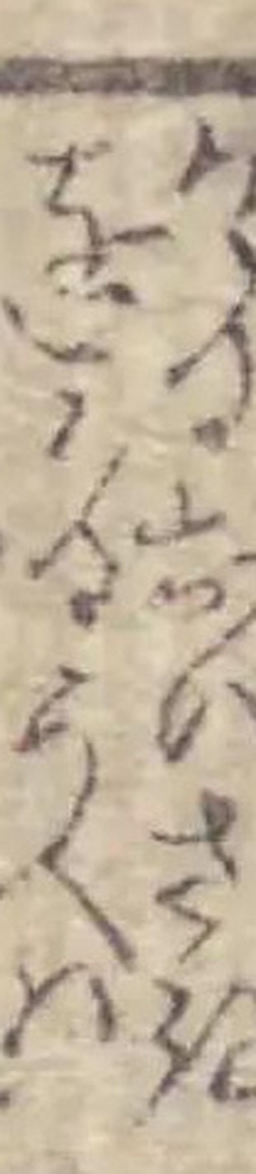をみるうへは
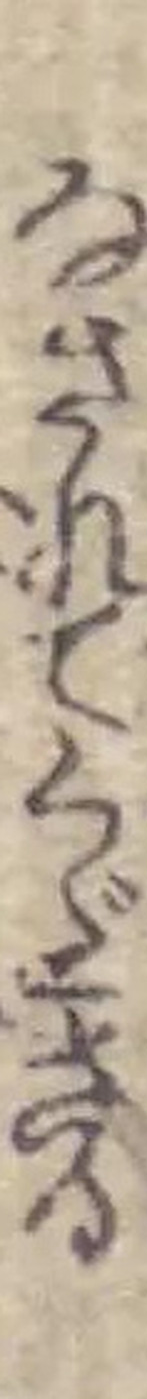なされてくださる
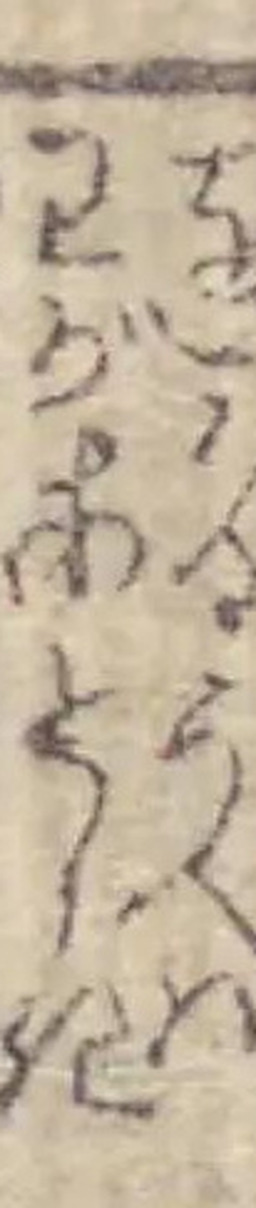わがあとしき
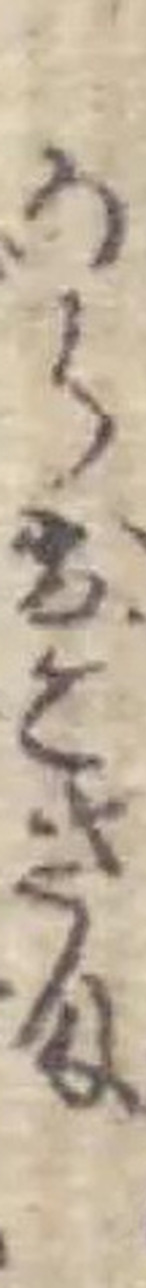からおこさま
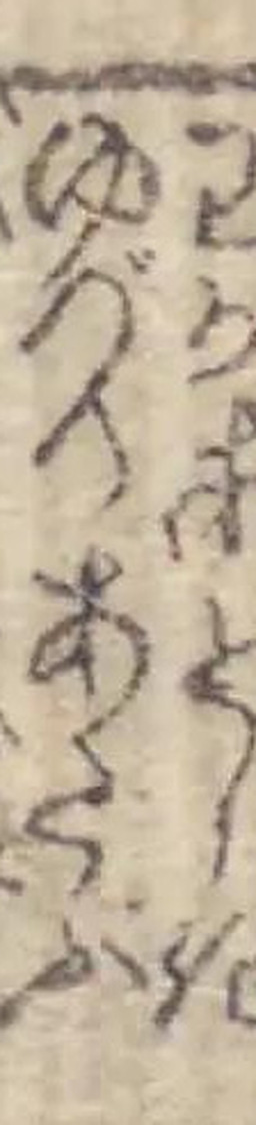ゆづりあたふ
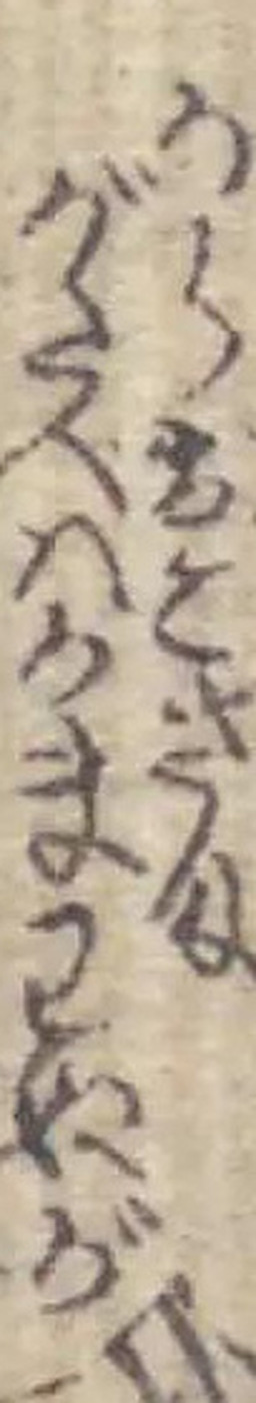がたへはかまわぬが
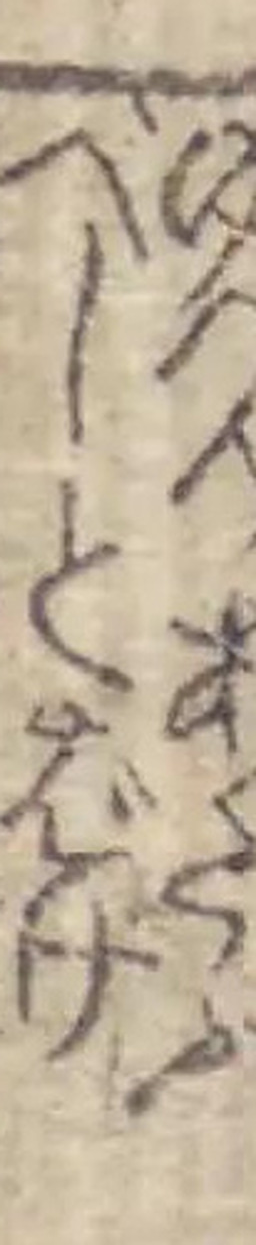べしとばけ
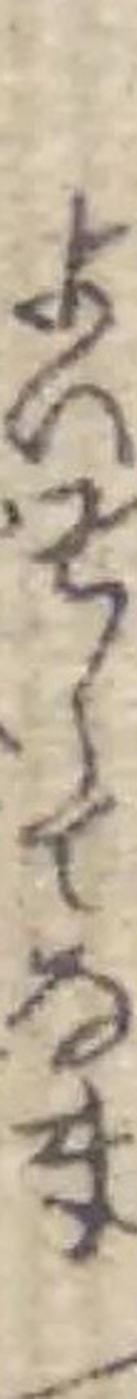よいそしてなま
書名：化物尽 4巻
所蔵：国立国会図書館 National Diet Library, JAPAN
